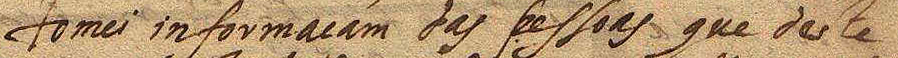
tomei informaçam das pessoas que deste
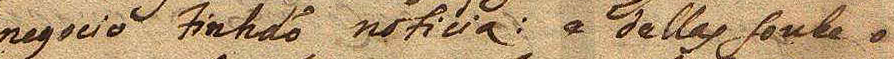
negocio tinhão noticia: e dellas soube o
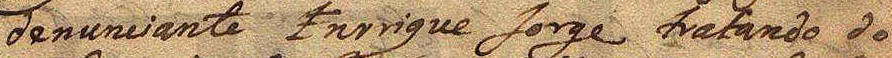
denunciante Enrrique Jorge tratando do
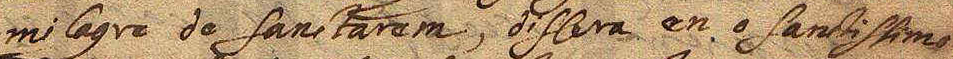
milagre de sanctarem, dissera en o sanctissimo
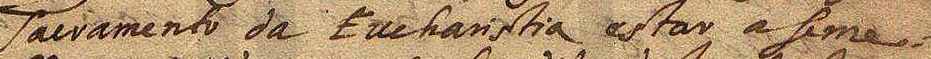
sacramento da Eucharistia estar a seme
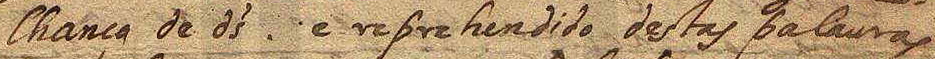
lhança de ds̄. e reprehendido destas palauras
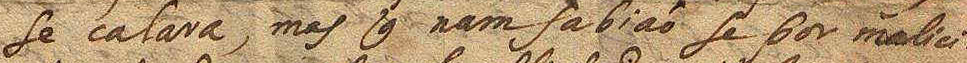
se calara, mas q̄ nam sabiaõ se por malicia
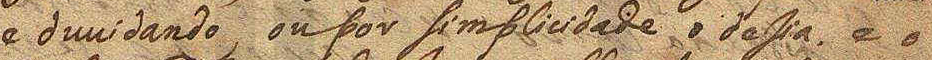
e duuidando, ou por simplicidade o desia. e o
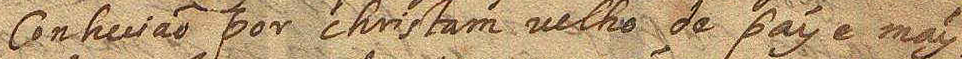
Conheciaõ por christam uelho de pay e may.
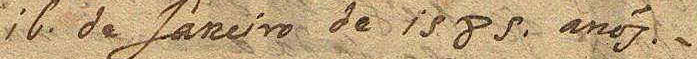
i6. de Janeiro de i585. anos̄.
